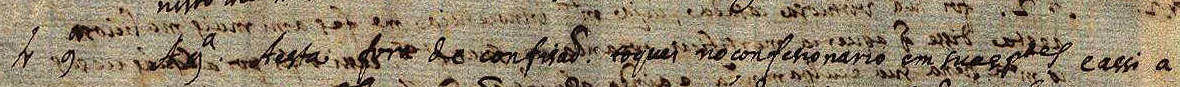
item 9 A 9.a A esta fora de confisaõ. toquei no confesionario em suas ptes e assi a
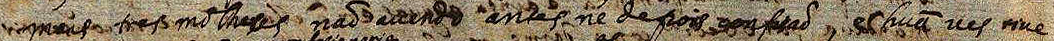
mais tres molheres naõ auendo antes nē depois confisaõ, e huā ues tiue
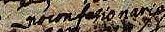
no confisionario
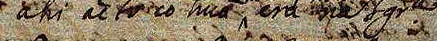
ahi acto cō huā era na Igr.a
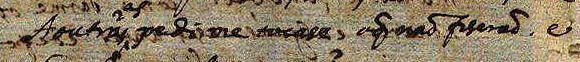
A outras 2as pedi me tocase o q̄ naõ fiseraõ. e
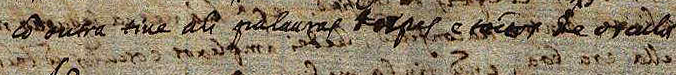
cō outra tiue ali palauras torpes e tactos de osculos
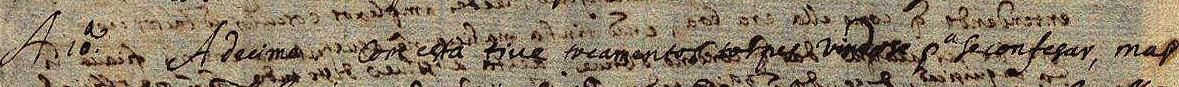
A 10.a A decima. Com esta tiue tocamentos torpes vindose p.a se confesar, mas
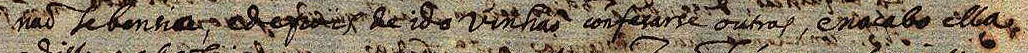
naõ se bensia, e depois de ido vinhaõ confesarse outras, e no cabo ella
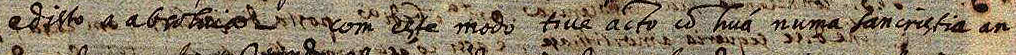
e disto a absolui _ com este modo tiue acto cō huā numa sancristia an
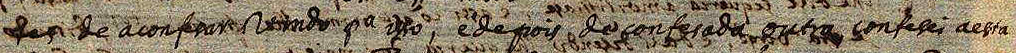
tes de a confesar vindo pa isso, e depois de confesada outra confesei a esta
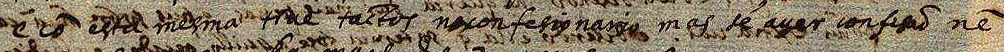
e cō esta mesma tiue tactos no confesionario mas sē auer confisaõ nē
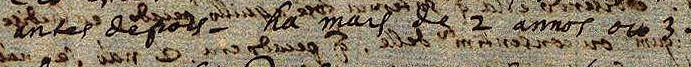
antes depois - ha mais de 2 annos ou 3.
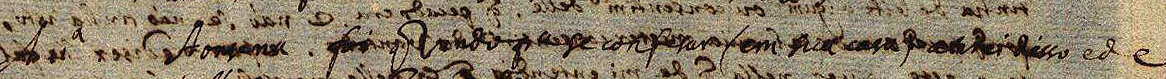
A 11a A onseaua. foi q̄ vindo pa se confesar (em sua casa) a tirei disso e de
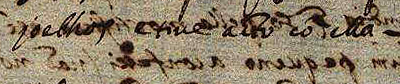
joelhos e tiue acto cō ella -
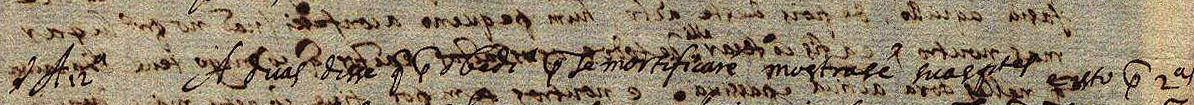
item A 12a A duas disse q̄ p̄ obedia p̄ se mortificarē mostrasē suas ptes e isto p̄ 2as
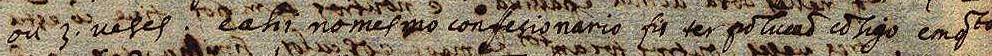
ou 3. ueses. e ahi no mesmo confesionario fis ter poluçaõ cōsigo emqto
